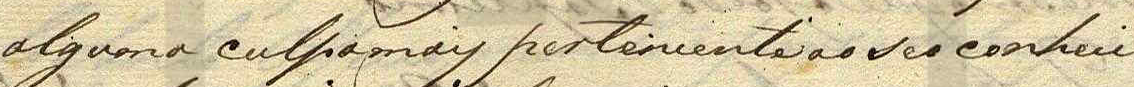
alguma culpa mais pertencente ao seo conheci
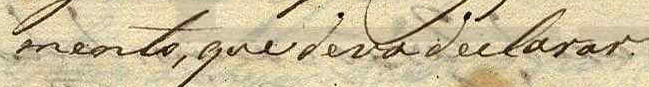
mento, que deva declarar.
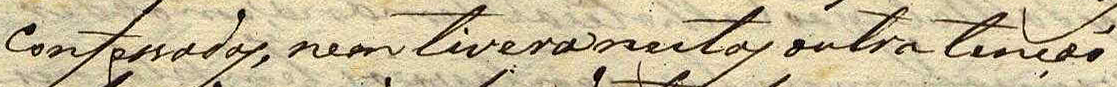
confessadas, nem tivera nestas outra tençaõ
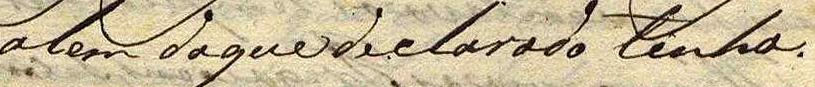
alem da que declarado tenha.
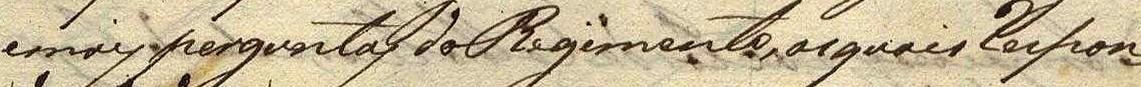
e mais perguntas do Regimento, as quais respon
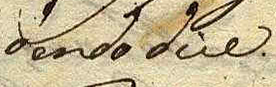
dendo dice
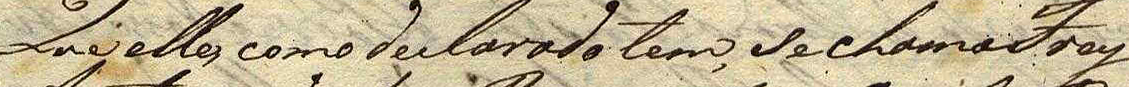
Que elle, como declarado tem, se chama Frey
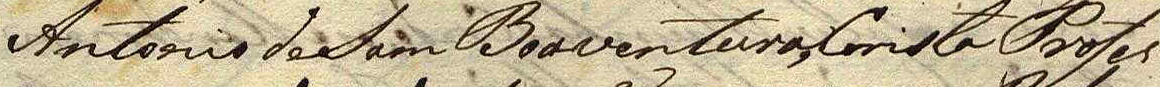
Antonio de Sam Boaventura, Corista Profes
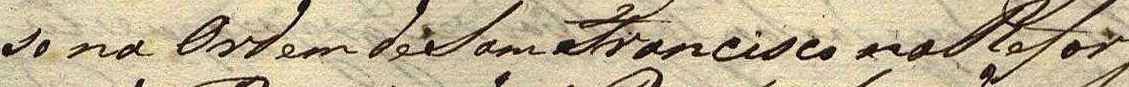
so na Ordem de Sam Francisco na Refor
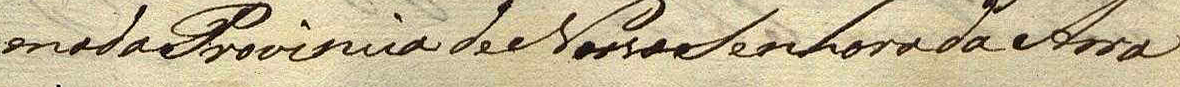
mada Provincia de Nossa Senhora de Arra
